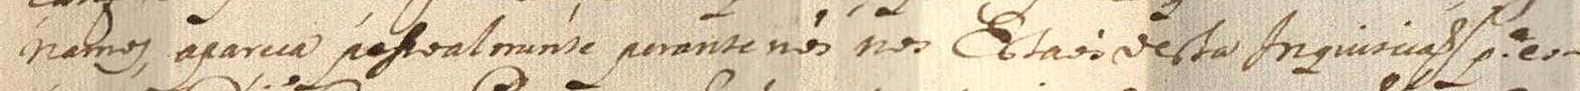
namos, apareça pessoalmente perante nós nos Estaós desta Inquisiçaõ p.a es
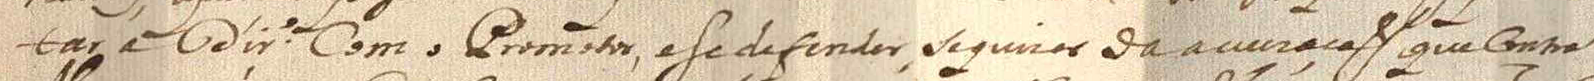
tar a dir.o Com o Promotor, e se defender, se quizer da accuzaçaõ que contra
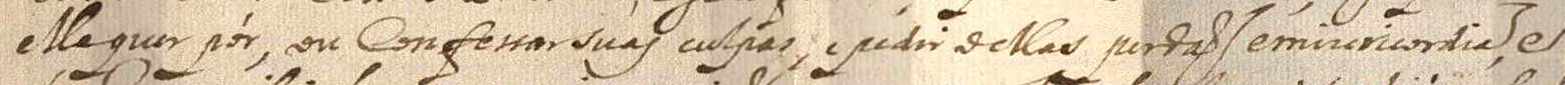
elle quer pór, ou Confessar suas culpas, e pedir dellas perdaõ e mizericordia, e
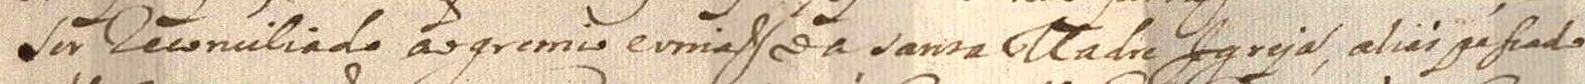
ser Reconciliado ao gremio e vniaõ da santa Madre Jgreja, aliás passado
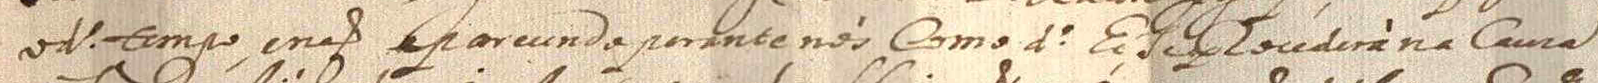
o d.o tempo, e naõ aparecendo perante nós Como d.o he se pRocederá na Cauza
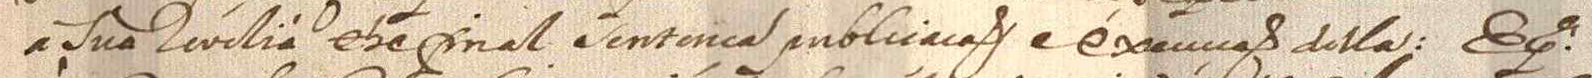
á sua Revelia e he final sentença publicaçaõ e execuçaõ della: E p.a
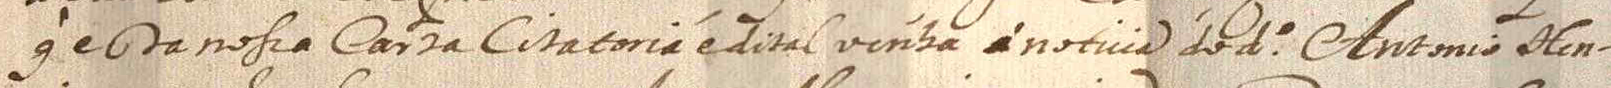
q̄ esta nossa Carta Citatoria edital venha á noticia do d.o Antonio Hen
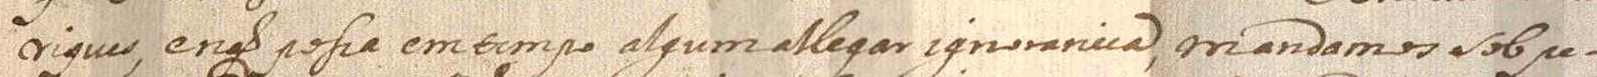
riques, e naõ possa em tempo algum allegar ignorancia, mandamos sob pe
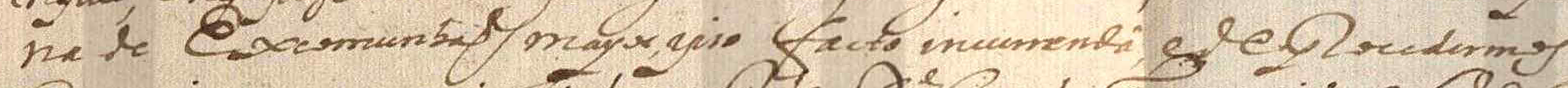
na de Excomunhaõ mayor, ipso facto incurrenda, e de pRocedermos
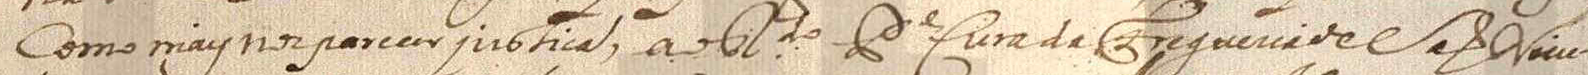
Como mais nos parecer justiça, ao R.do Pe Cura da Freguezia de Saõ Nicu
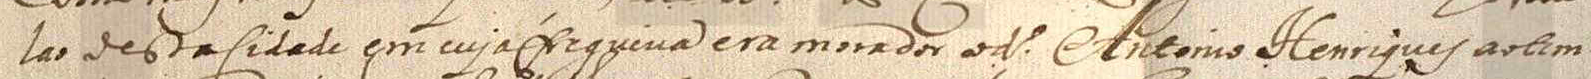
lao desta Cidade em cuja freguezia era morador o d.o Antonio Henriques ao tem
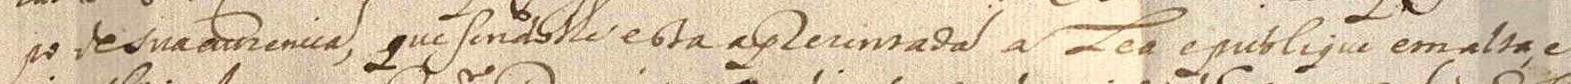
po de sua auzencia, que sendolhe esta apRezentada a Lea, e publique em alta, e
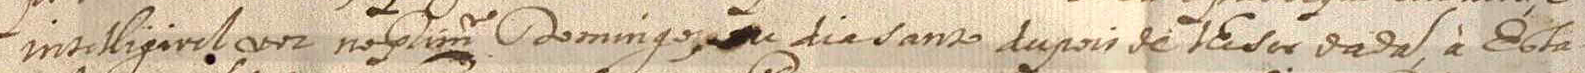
intelligivel voz no pRimro Domingo, ou dia santo depois de lhe ser dada, à Esta
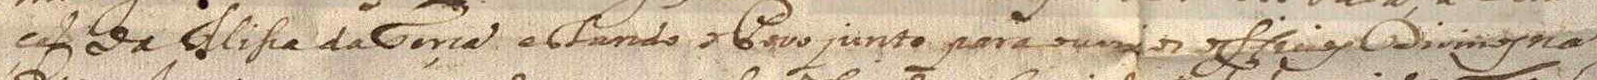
çaõ da Missa da Terça estando o Povo junto para ouvir os officios Divinos na
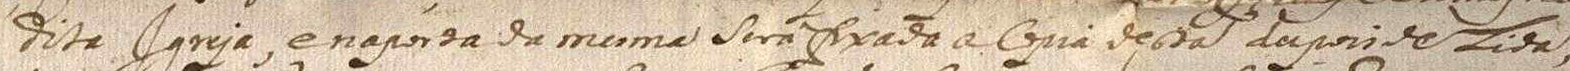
dita Jgreja, e na porta da mesma será fixada a Copia desta depois de Lida,
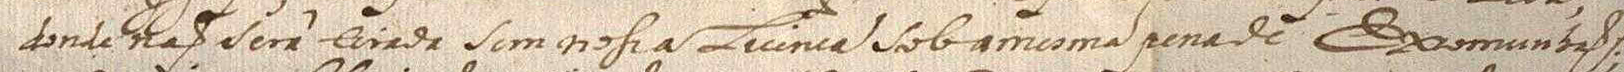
donde naõ será tirada sem nossa Licença sob a mesma pena de Excomunhaõ
